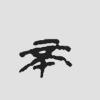不
